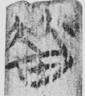昔
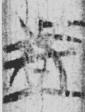者
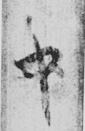仲
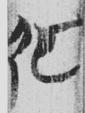○（尼）
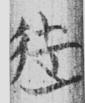徒
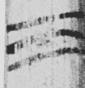三
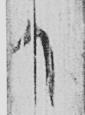人
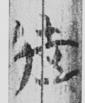徒
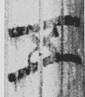五
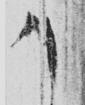人
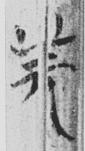芫
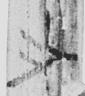之
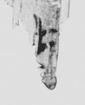徒
